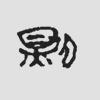則
